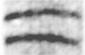二
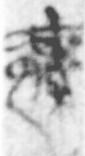○（秦）
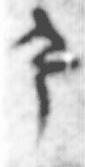弓
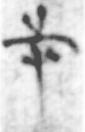矢
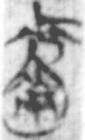○（箙）
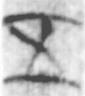五
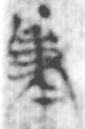秉
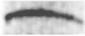一
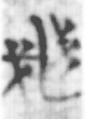○（戟）
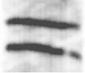二
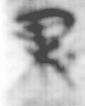果（戈）
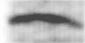一
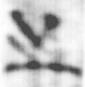之
